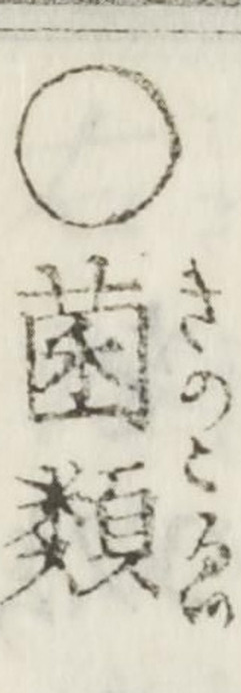〇菌類
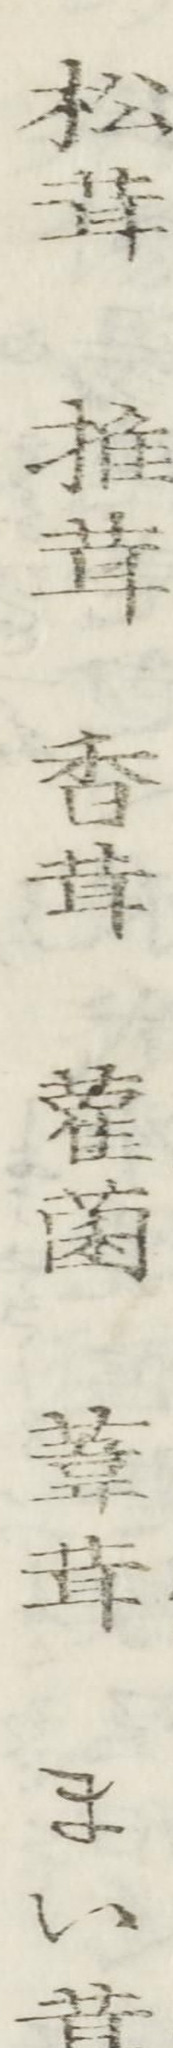松茸推茸香茸雚菌葦茸まい茸
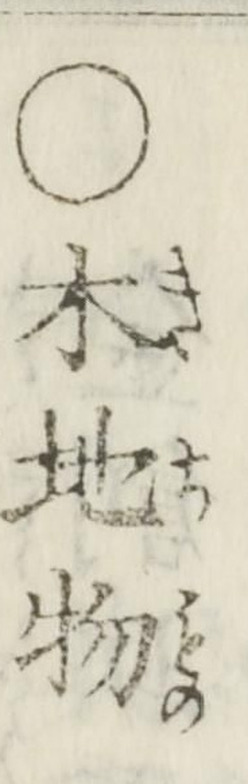〇木地物
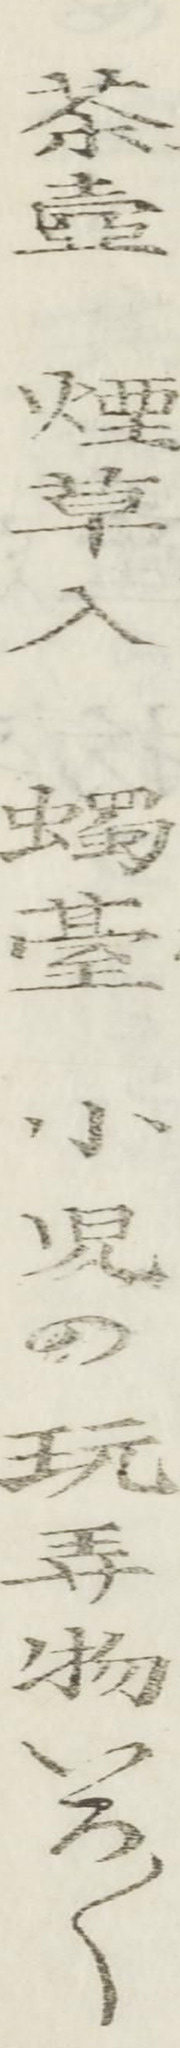茶壷煙草入燭台小児の玩弄具いろ〳〵
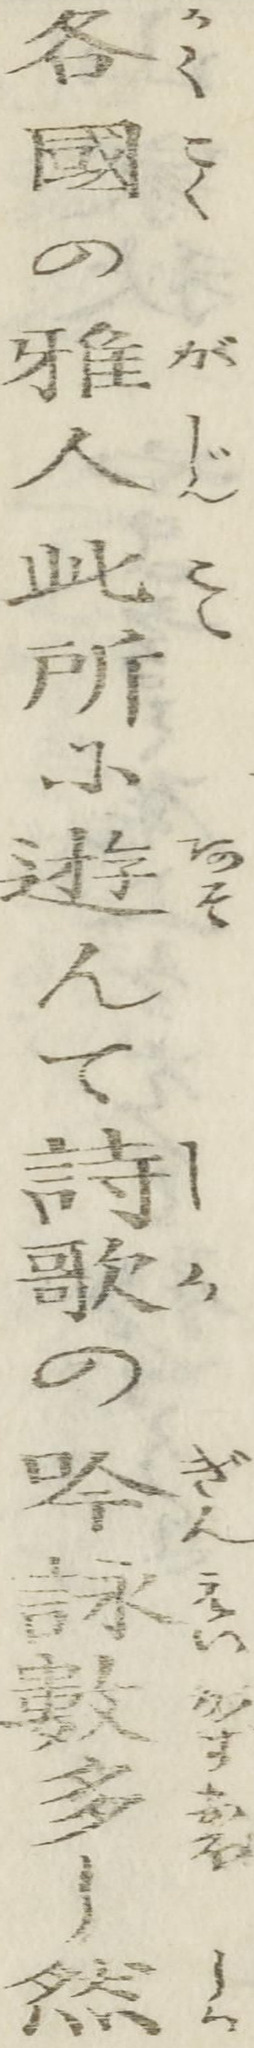各国の雅人此所に遊んて詩歌の吟詠数多し然
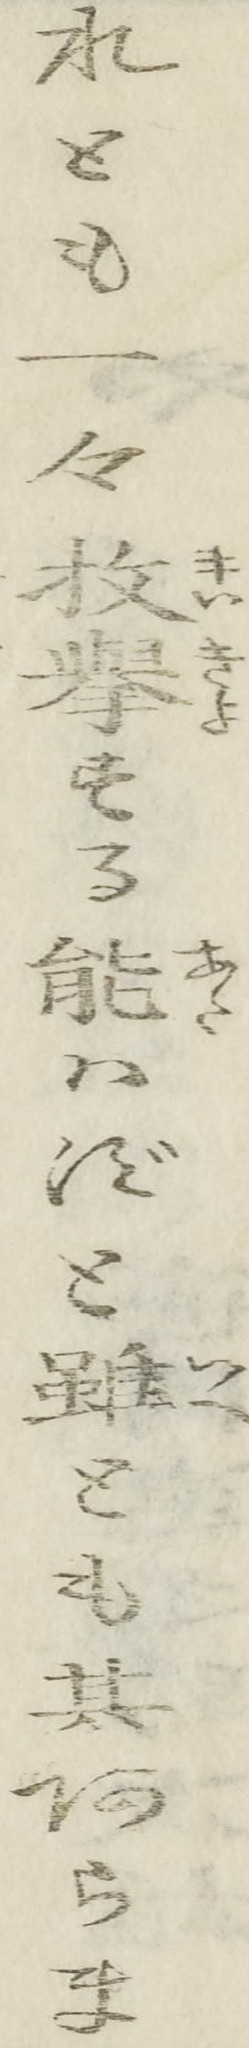れとも一々枚挙する能はずと雖とも其あらま
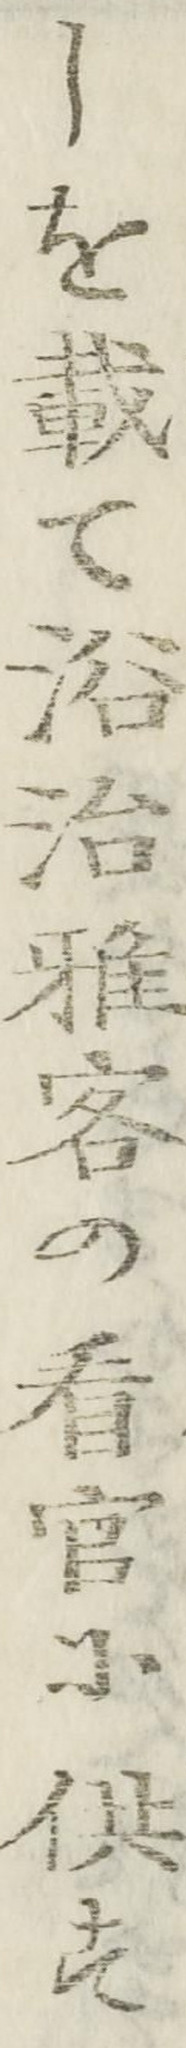しを載て浴治雅客の看官に供す
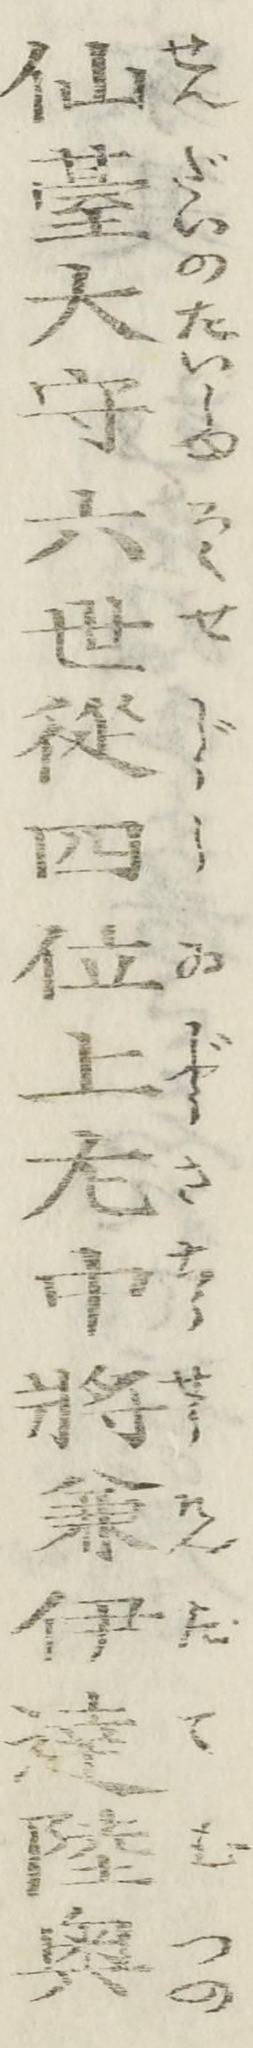仙台大守六世従四位上左中将兼伊達陸奥
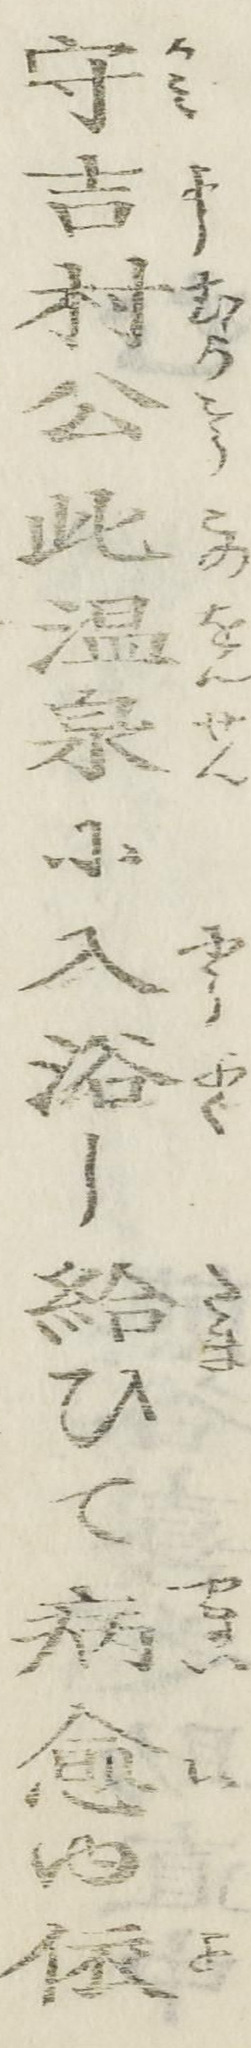守吉村公此温泉に入浴し給ひて病愈ゆ依
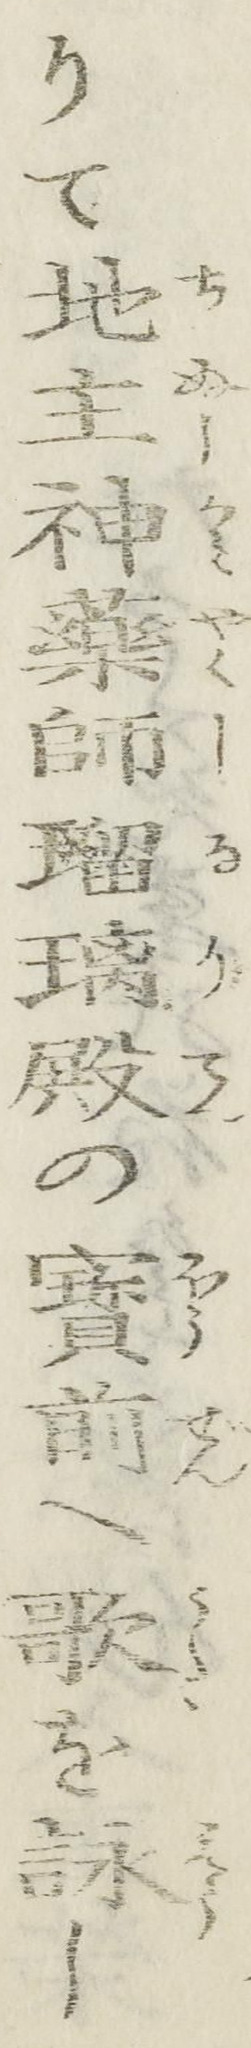りて地主神薬師瑠璃殿の宝前へ歌を詠し
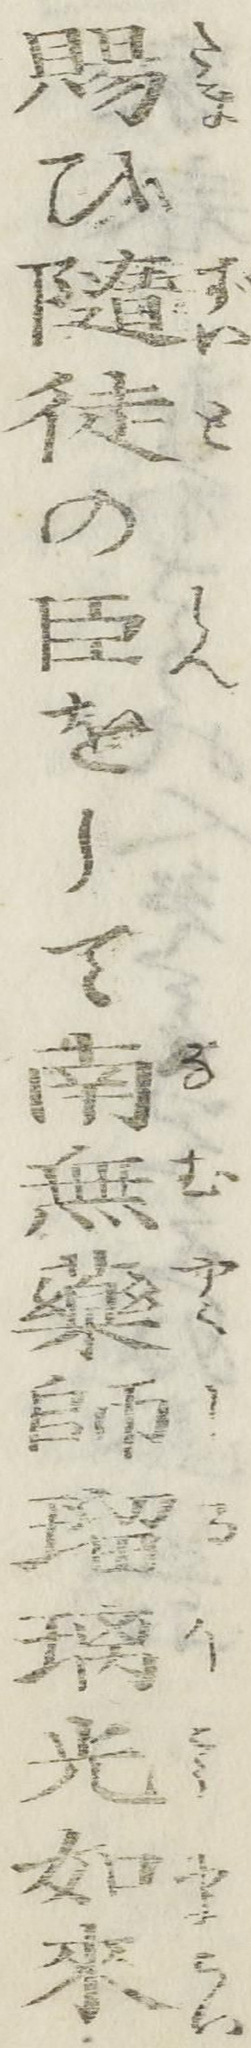賜ひ随徒の臣をして南無薬師瑠璃光如来
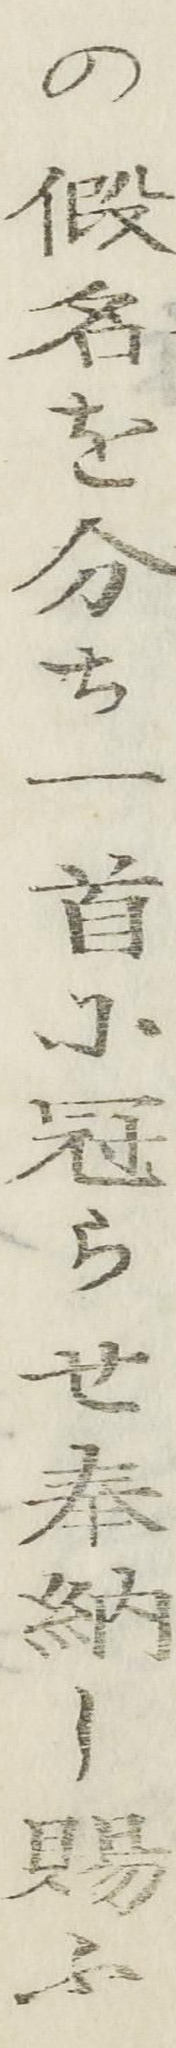の仮名を分ち一首に冠らせ奉納し賜ふ

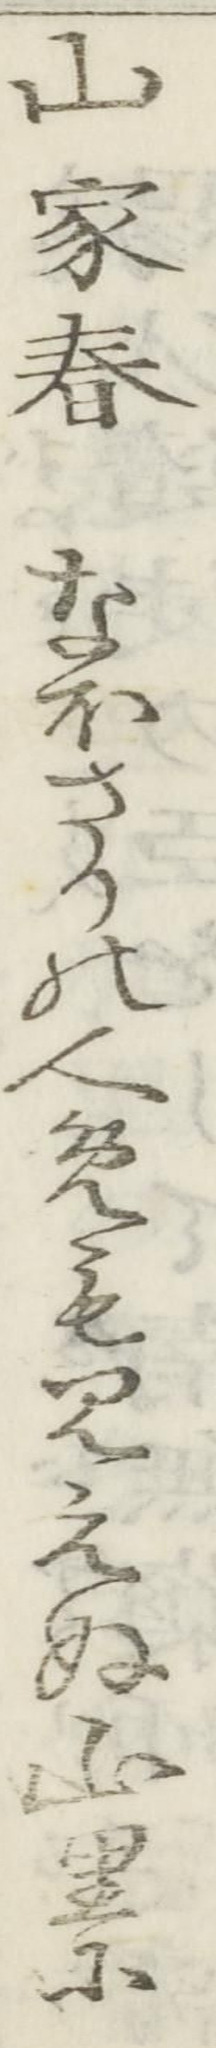山家春なほさりの人めも見えぬ山里に
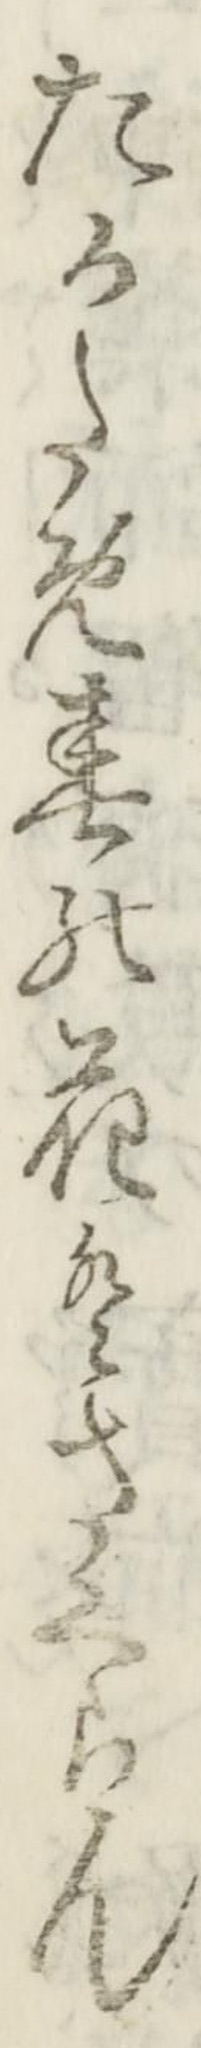たかため春の花そさくらん
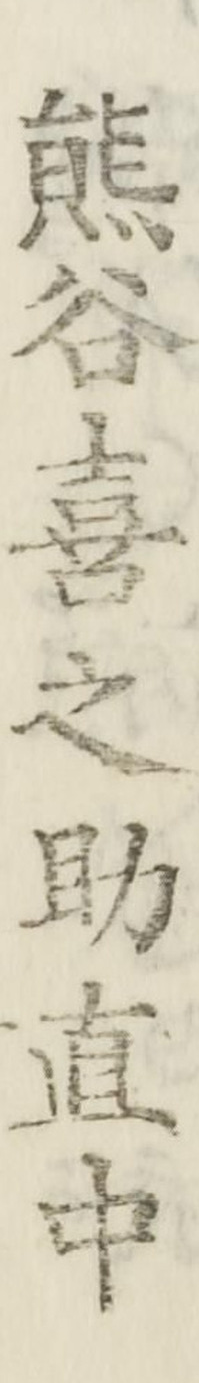む熊谷喜之助直中
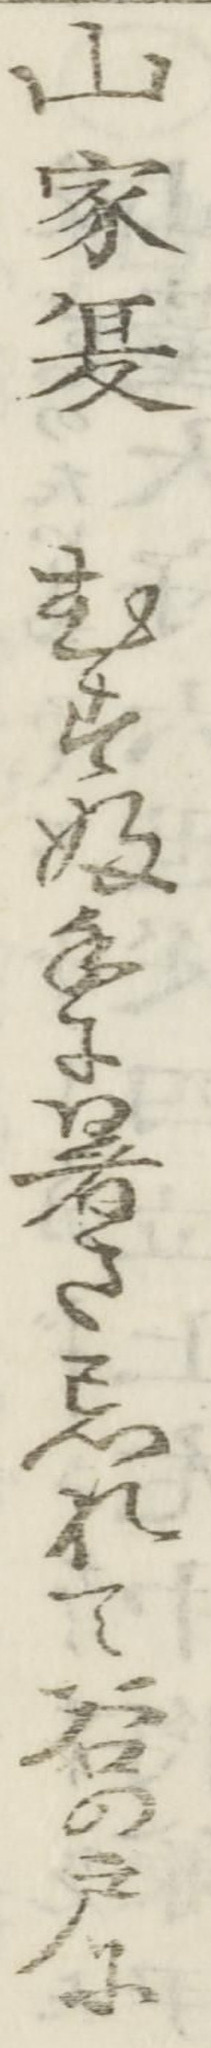山家夏むすふねに暑さ忘れて谷の戸に
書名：鎌先温泉由來記
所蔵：東京大学地震研究所図書室 Earthquake Research Institute Library, The University of Tokyo, JAPAN
